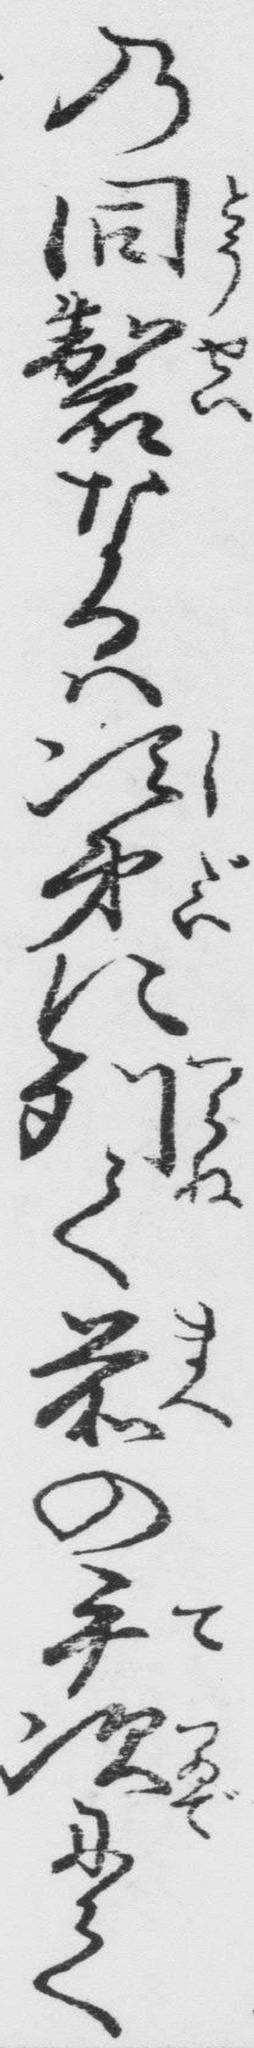の同製なるは次第に列て前の手次にて
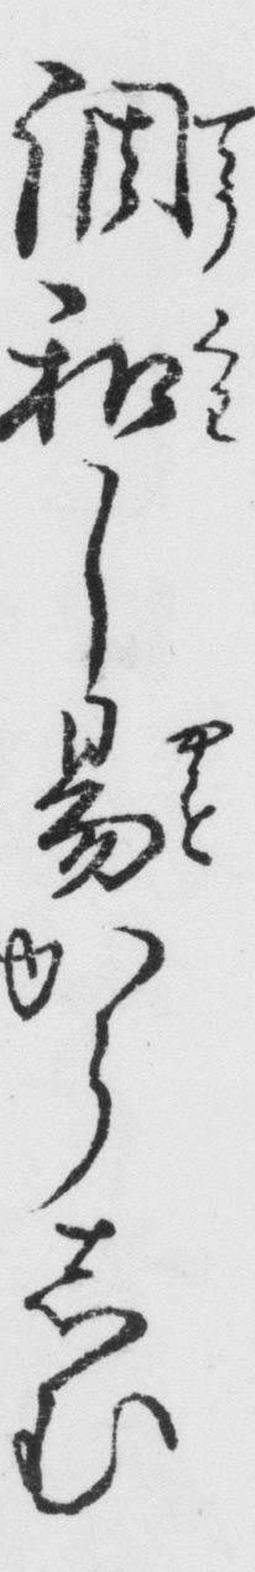調和し易からしむ
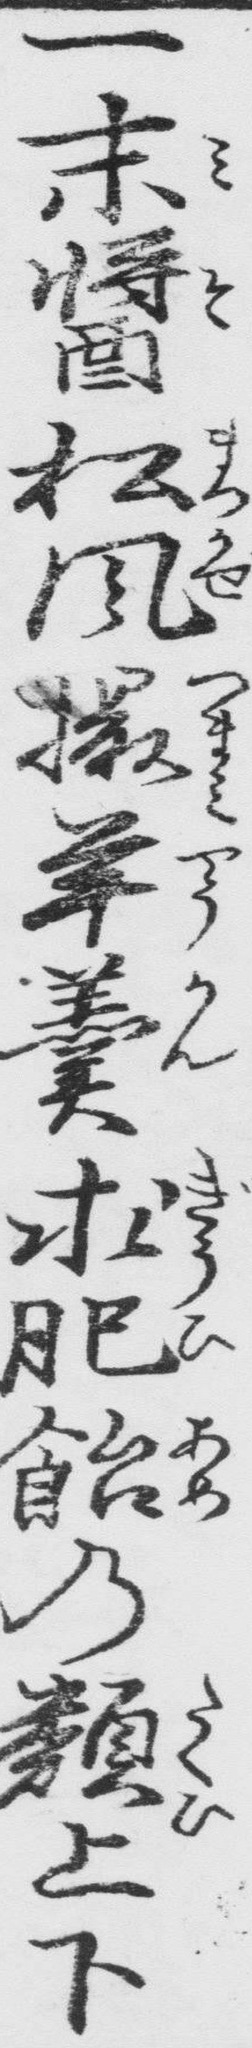一末醤松風撮羊羹求肥飴の類上下
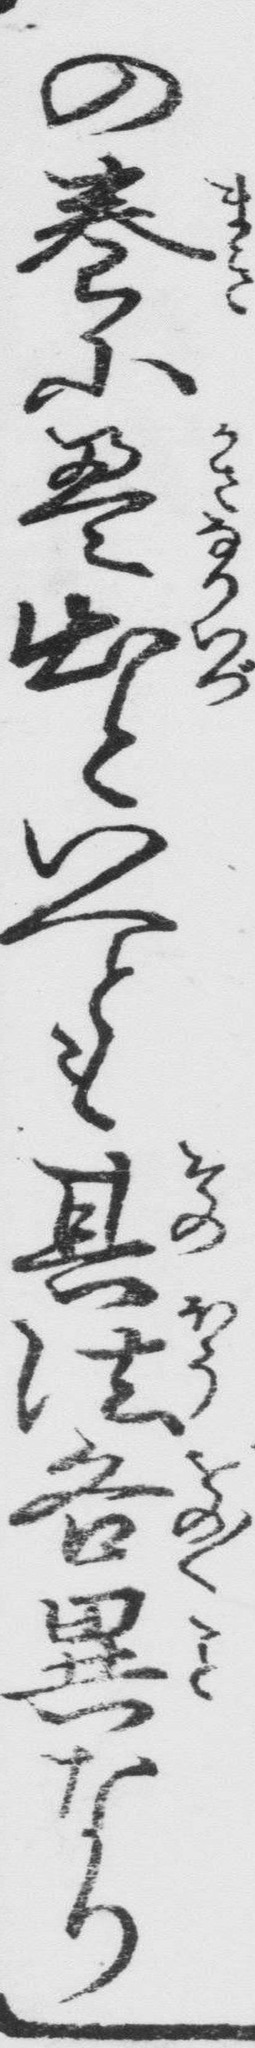の巻に畳出といへとも其法各異なり
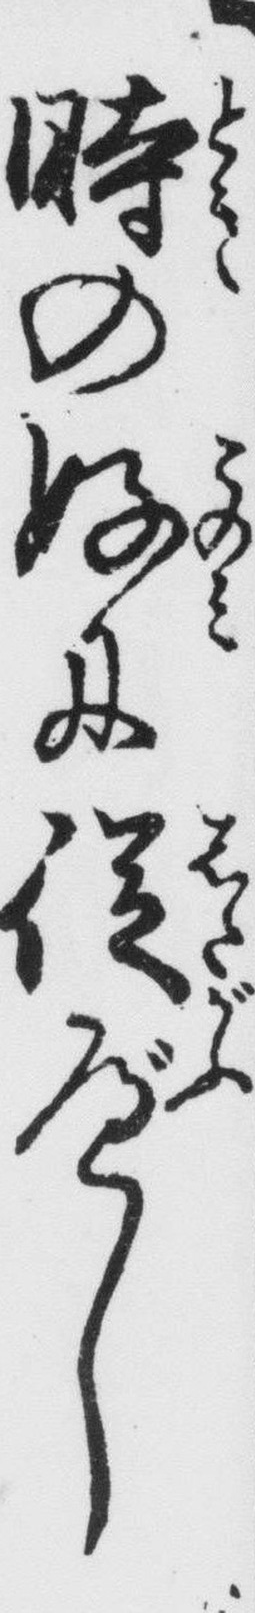時の好に従べし
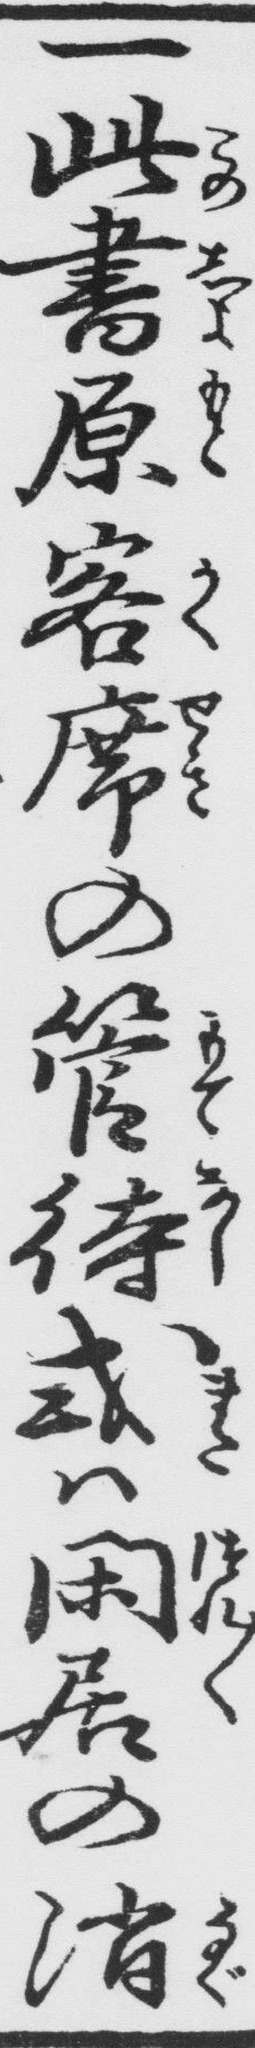一此書原客席の管待或は閑居の消
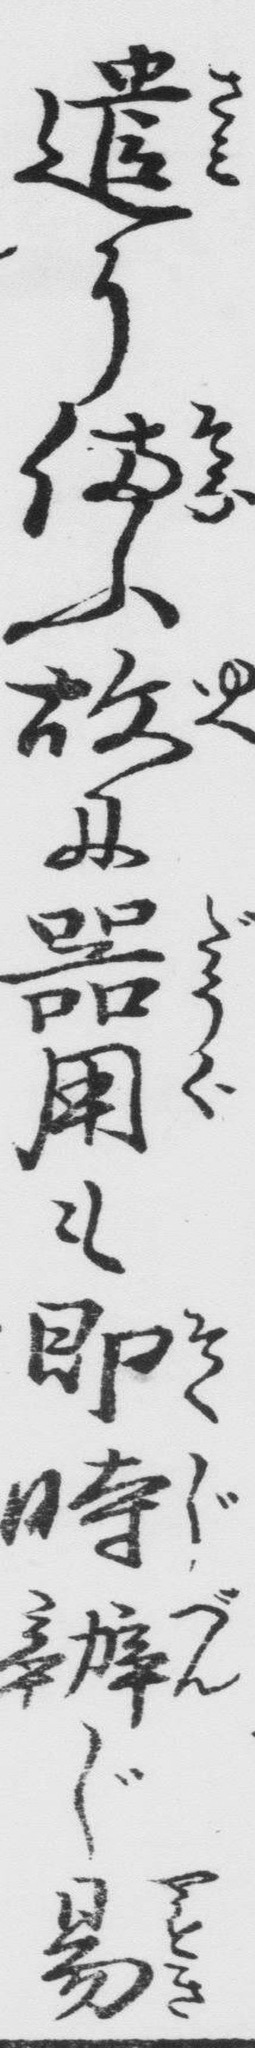遣に備ふ故に器用も即時弁じ易
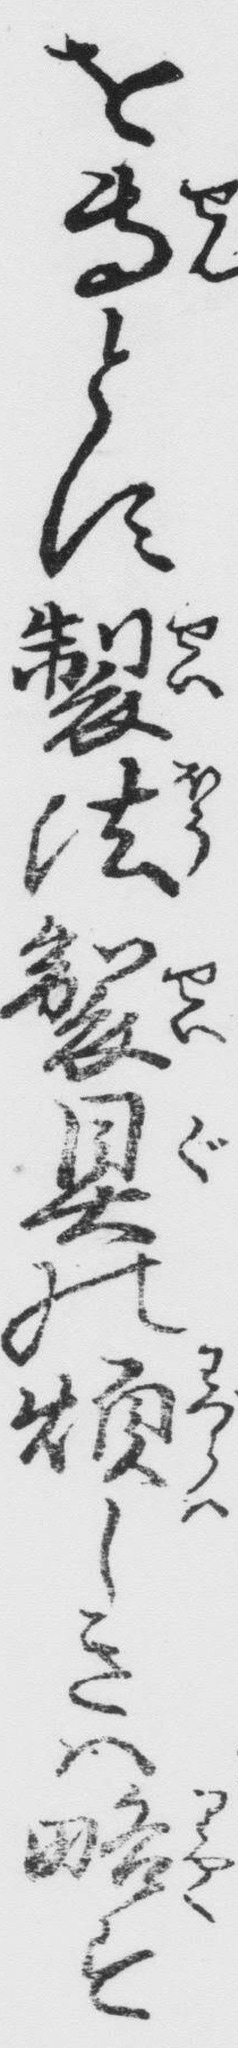を専とす製法製具の煩しきは略す

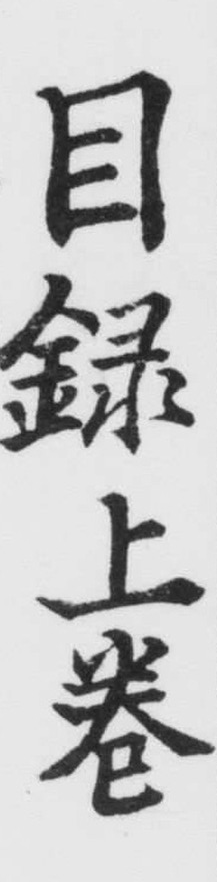目録上巻

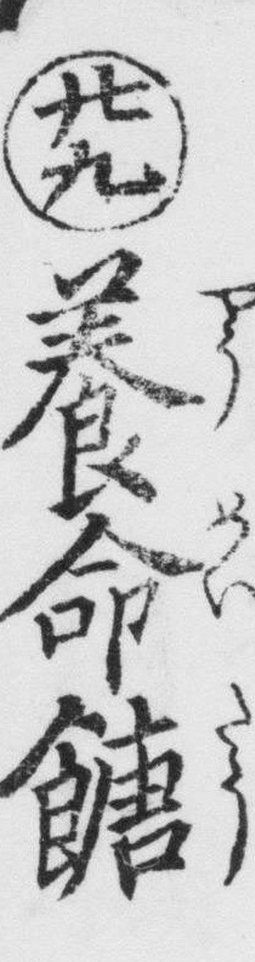(廿九)養命餹
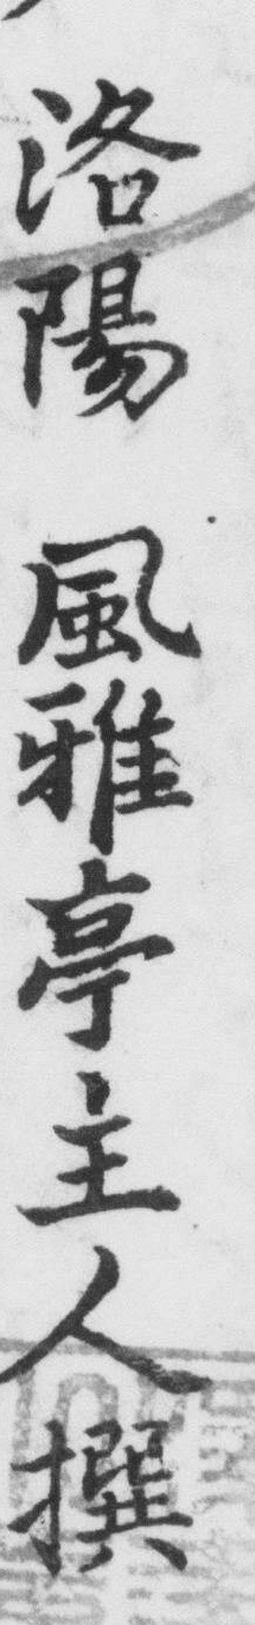洛陽風雅亭主人撰
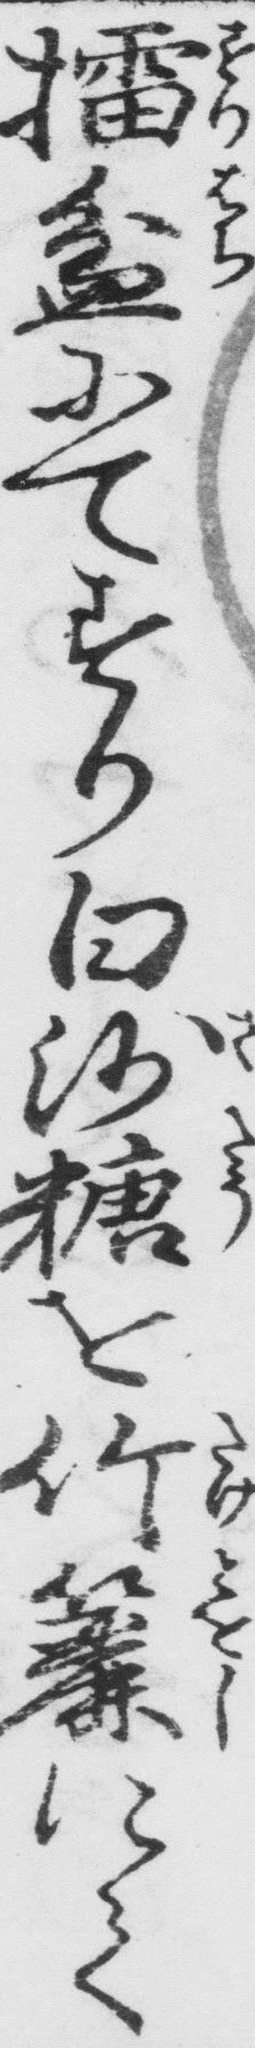擂盆にてすり白沙糖を竹簾にて
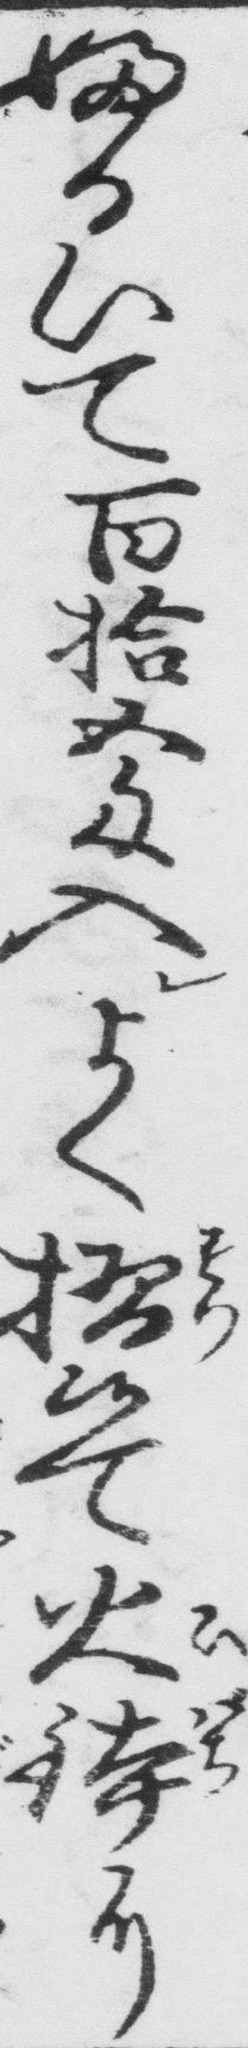ふるひて百拾五匁入れよく摺候て火鉢に
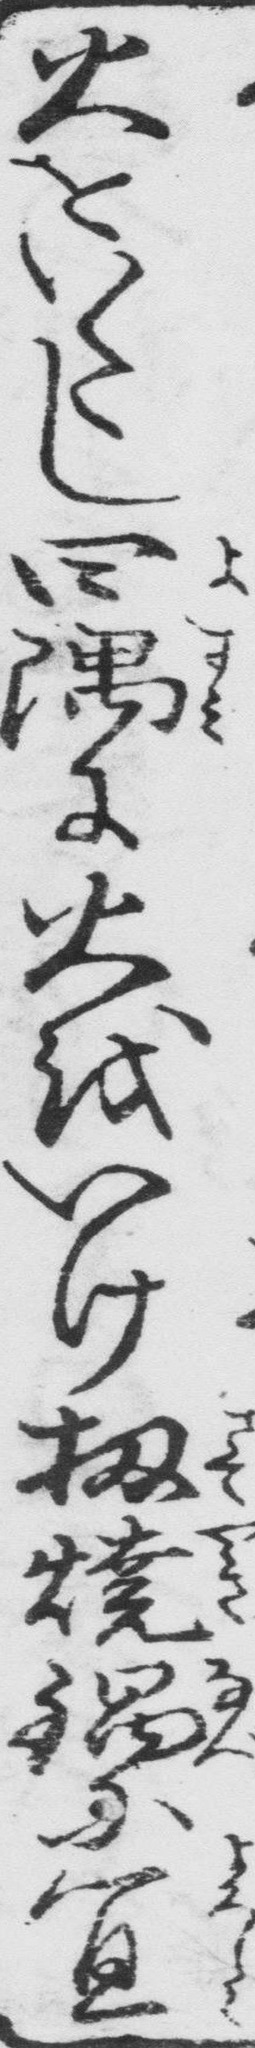火をいたし四隅に火をいけ扨焼鍋に宜

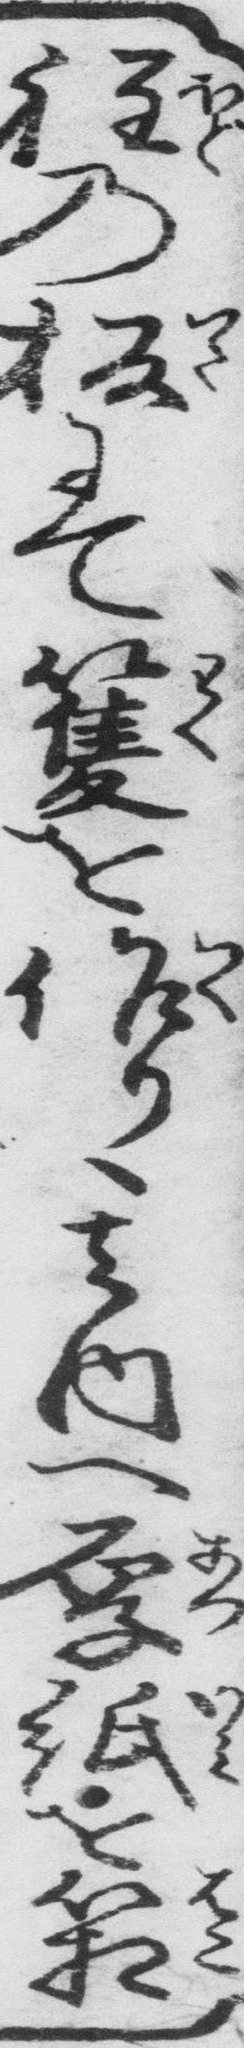程の板にて篗を作り其内へ厚紙を箱
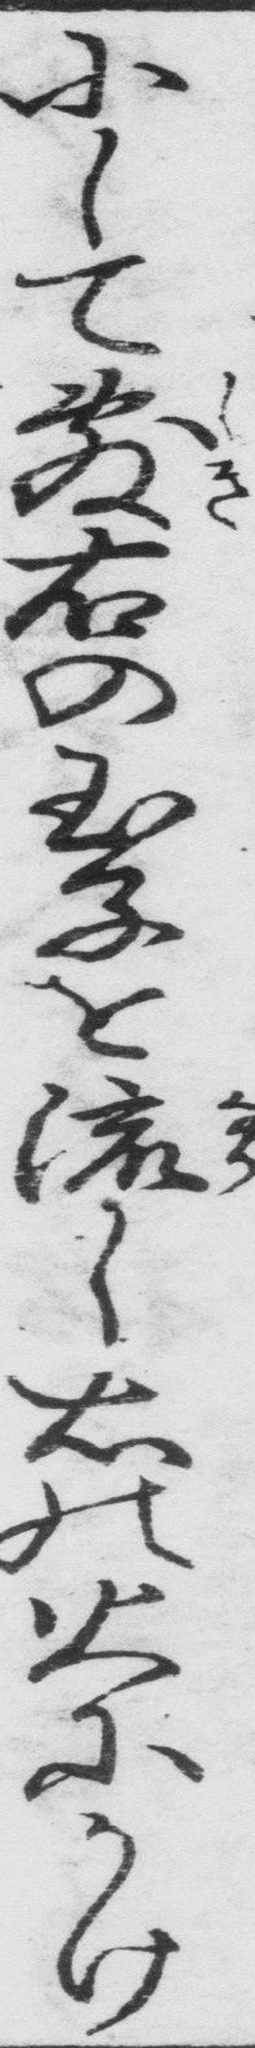にして敷右の玉子を流し右の火にかけ
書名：御前菓子図式
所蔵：大阪府立大学学術情報センター 国文学研究資料館
